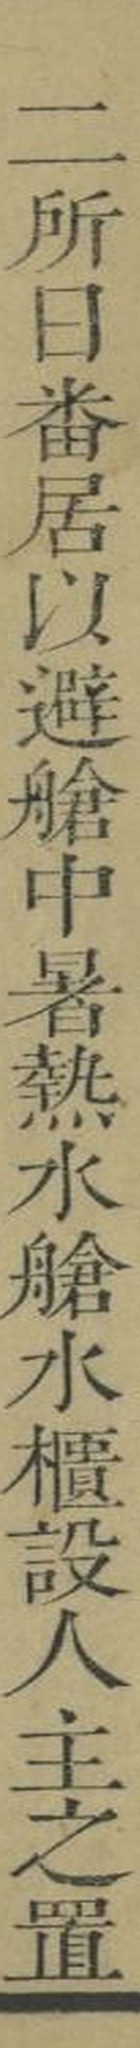二所日畨居以避艙中暑𤍠水艙水櫃設人主之置
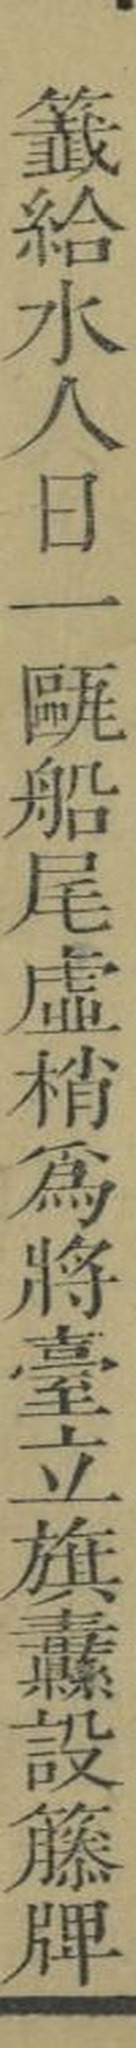籖給水人日一甌船尾虚梢爲將臺立旗纛設籐牌
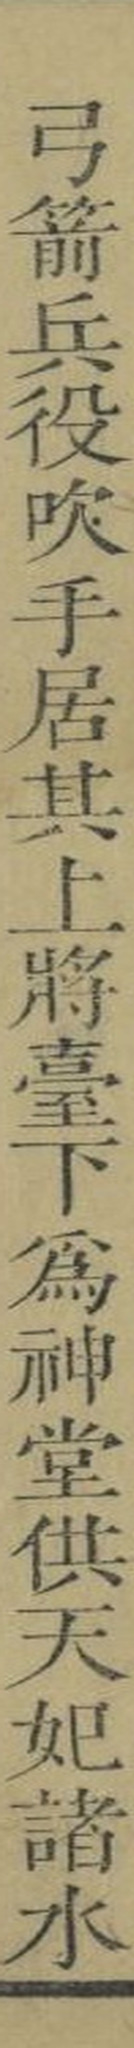弓箭兵役吹手居其上將臺下爲神堂供天妃諸水
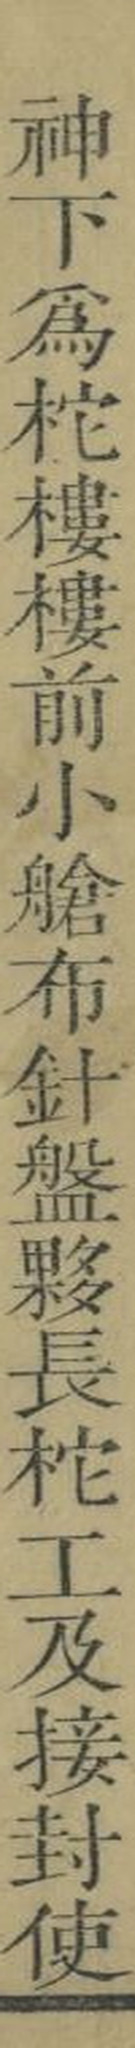神下爲柁樓樓前小艙布針盤夥長柁工及接封使
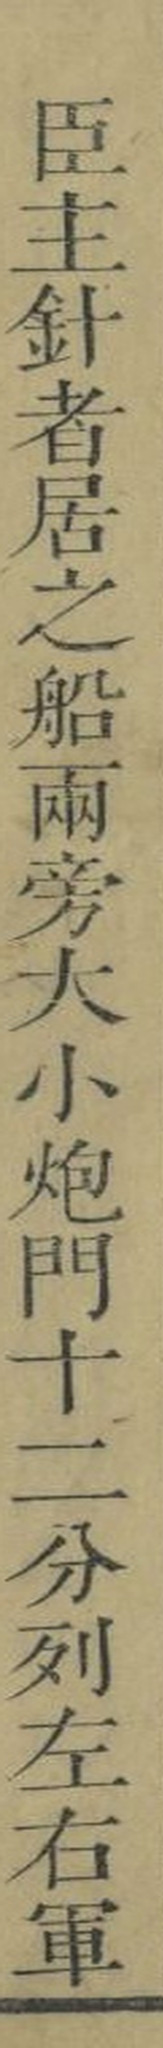臣主針者居之船兩旁大小炮門十二分列左右軍
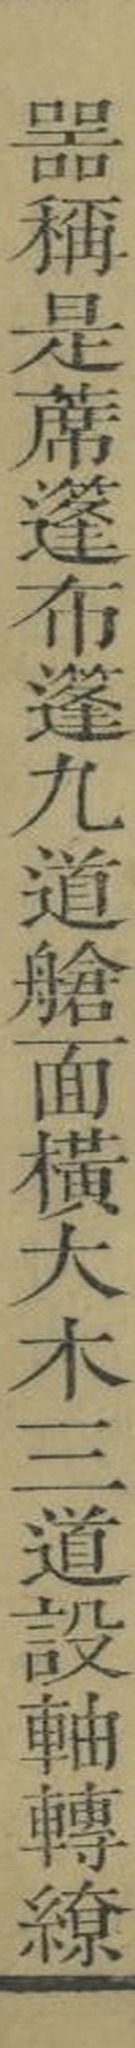噐稱是蓆篷布篷九道艙面橫大木三道設軸轉繚

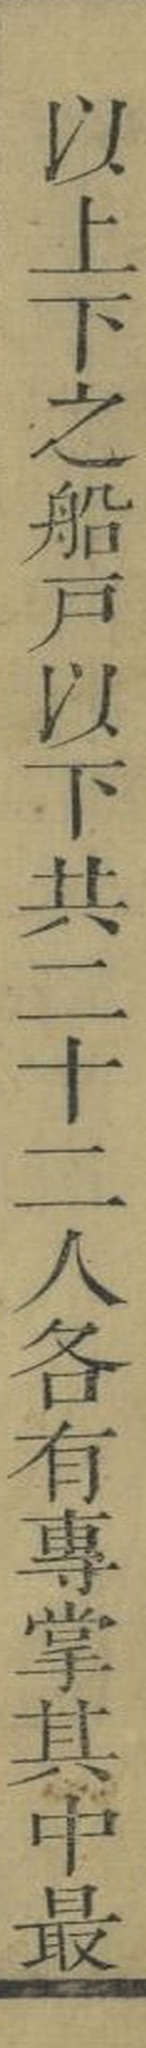以上下之船戸以下共二十二人各有專掌其中最
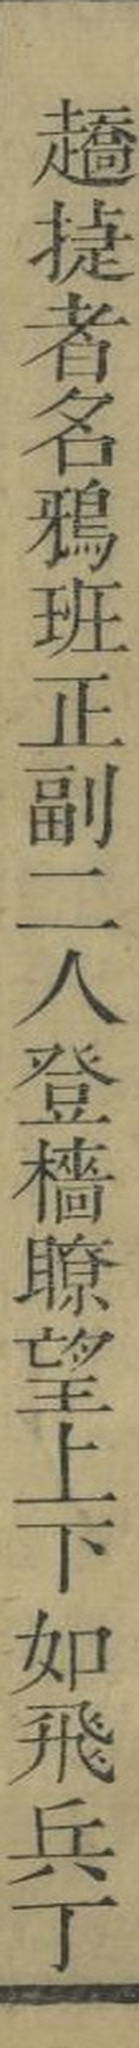趫㨗者名鴉班正副二人登檣瞭望上下如飛兵丁
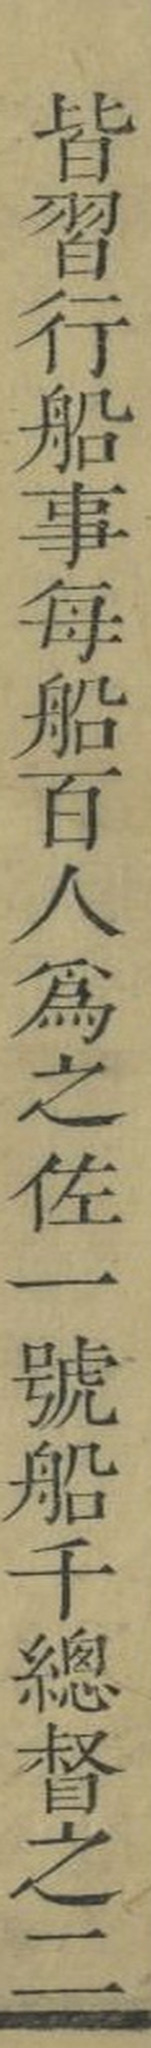皆習行船事每船百人爲之佐一號船千總督之二
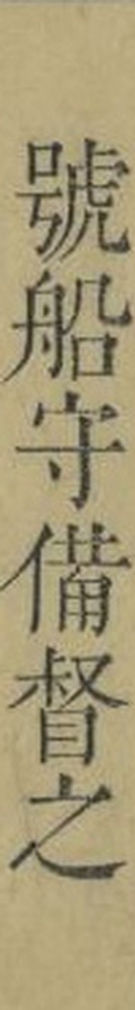號船守備督之
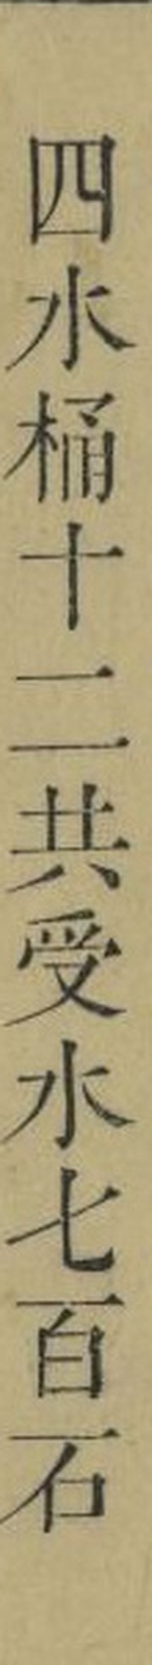四水桶十二共受水七百石
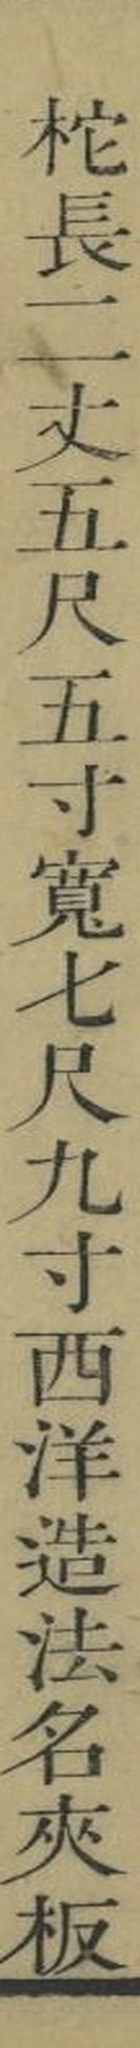柁長二丈五尺五寸寬七尺九寸西洋造法名夾板
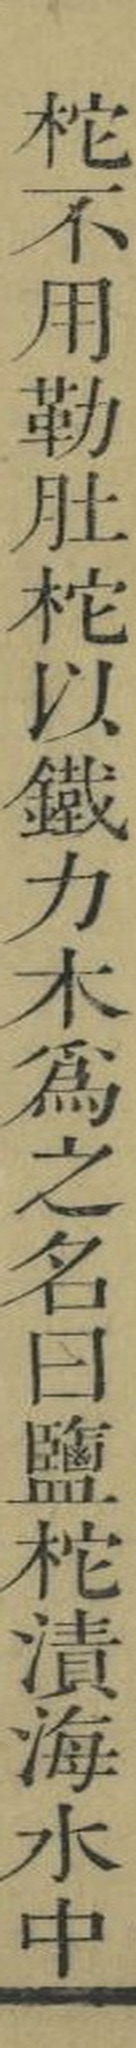柁不用勒肚柁以鐵力木爲之名曰鹽柁漬海水中

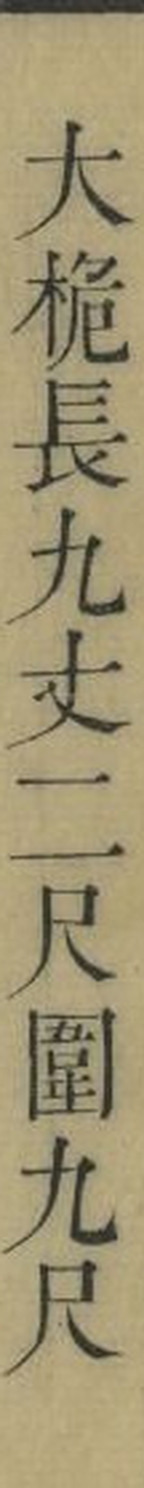大桅長九丈二尺圍九尺
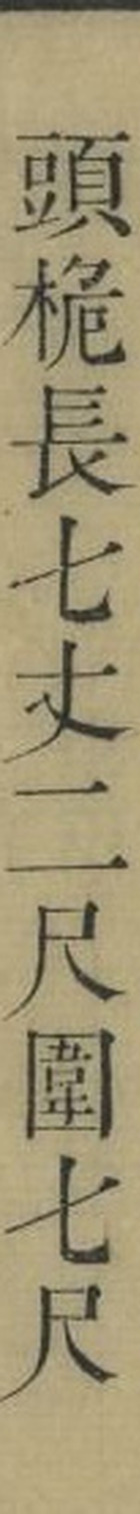頭桅長七丈二尺圍七尺
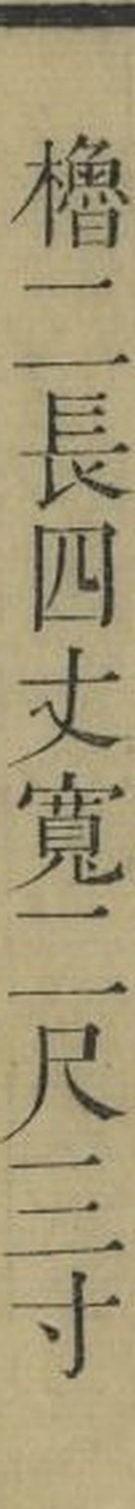櫓二長四丈寬二尺三寸
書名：中山伝信録 巻一
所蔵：University of the Ryukyus Library
